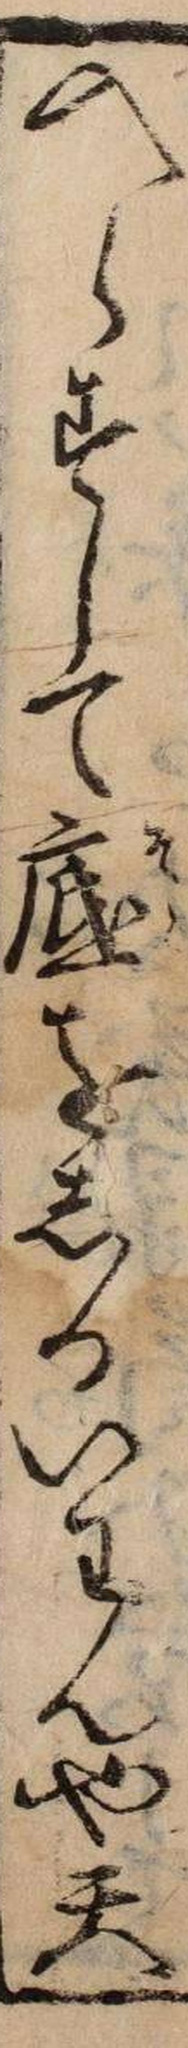入らすして底をしるいわんや天
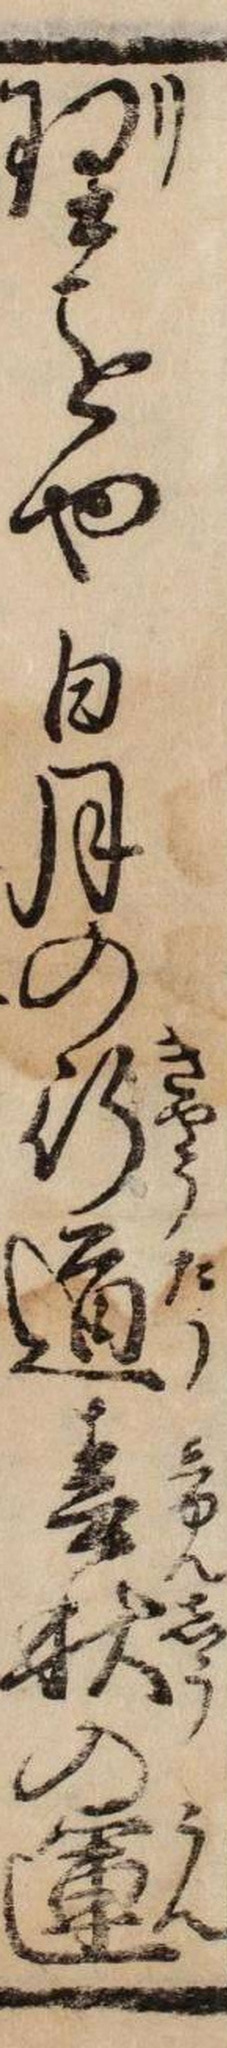理をや日月の行道春秋の運
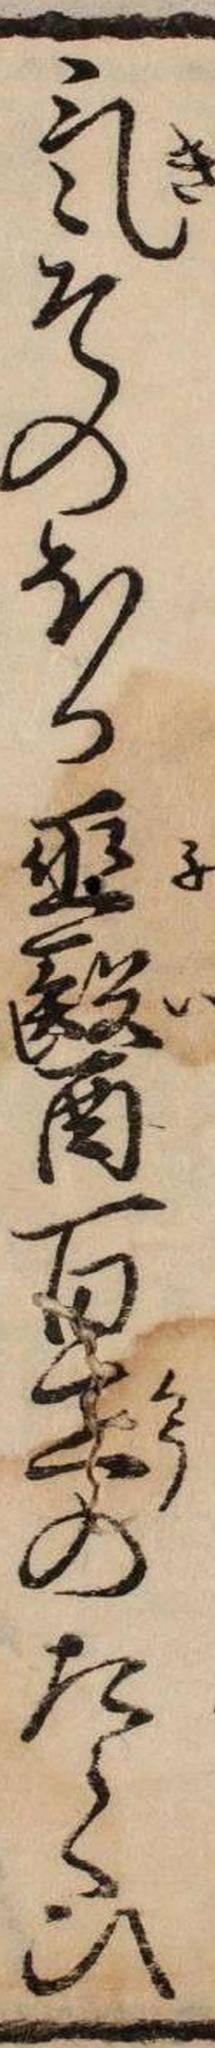気そのほか巫医百工のたくひ
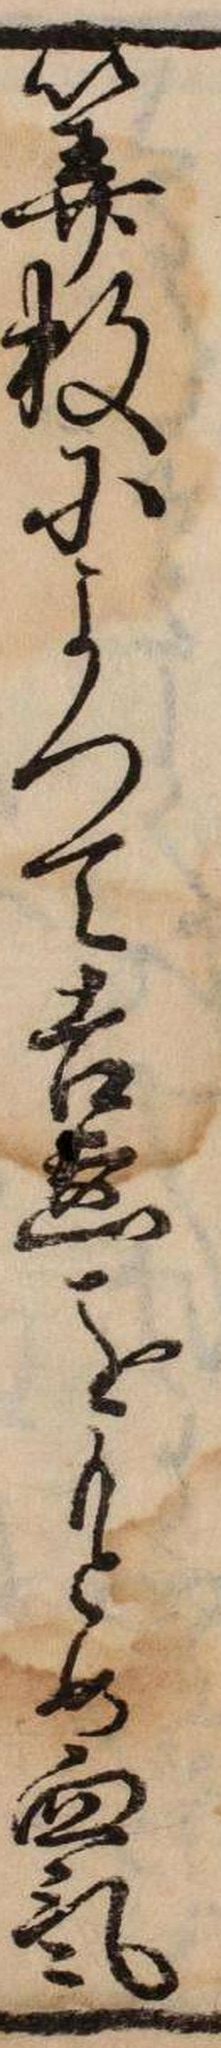筭数によつて吉凶をもとめ血気
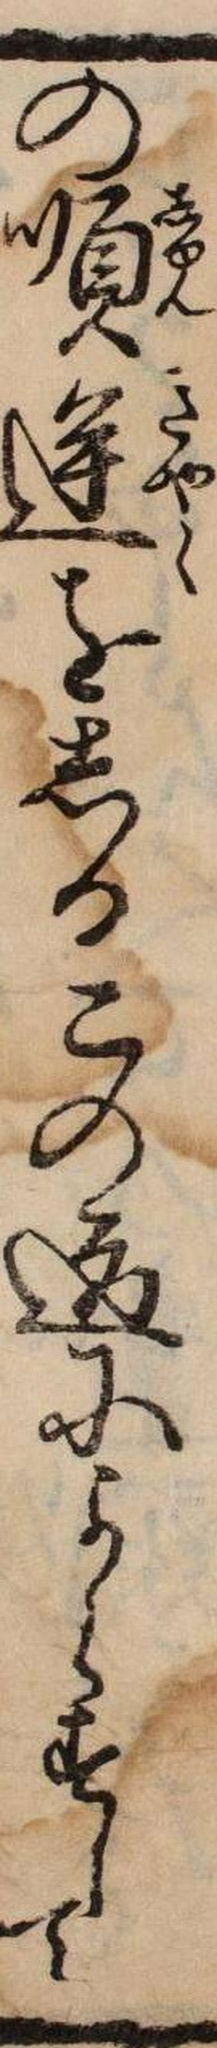の順逆をしるこの道によらすして
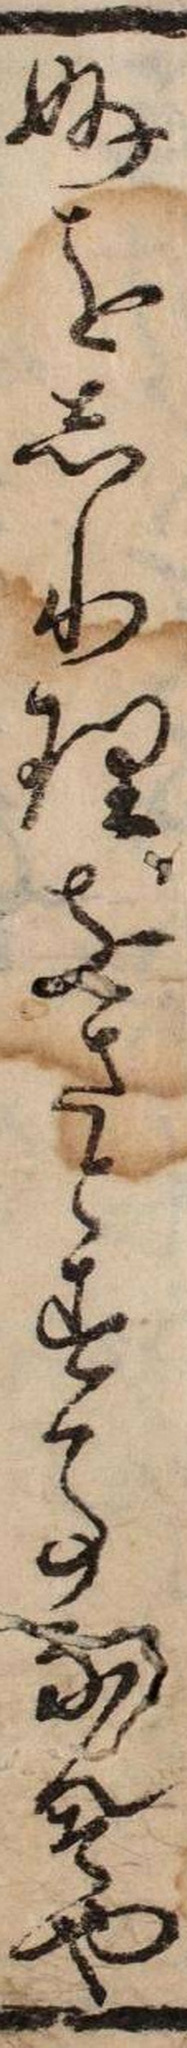妙をしり理をさとす事はなんそや
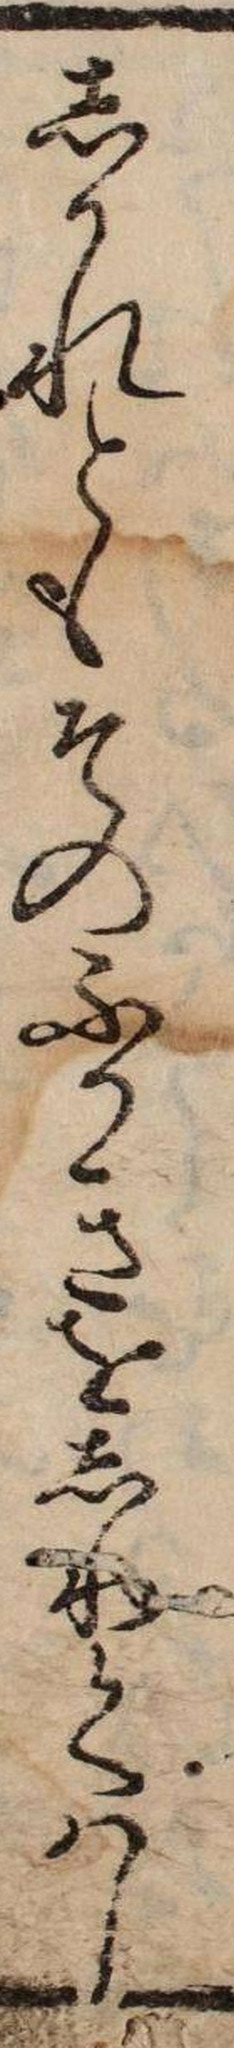しかれともそのふかきをしりくはし
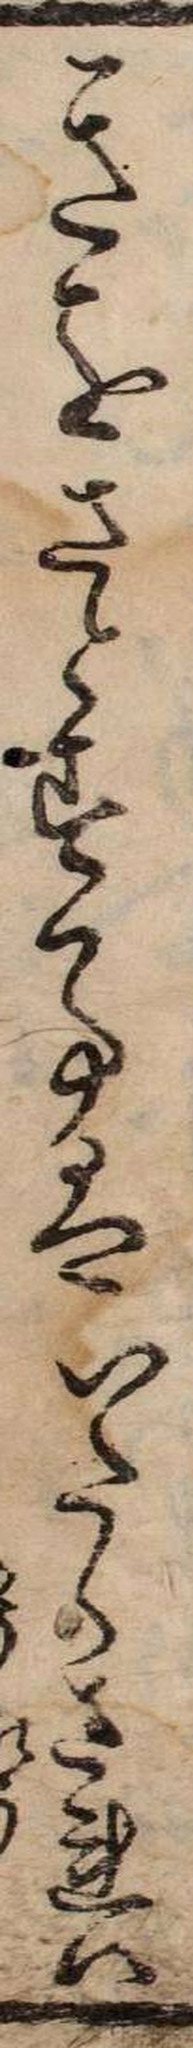きをさとす事はいたらされは
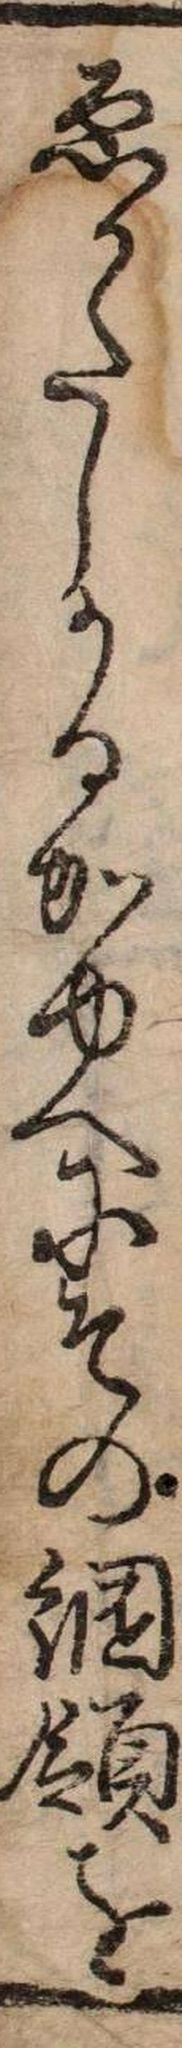ゑかたしかるかゆへにその綱領を

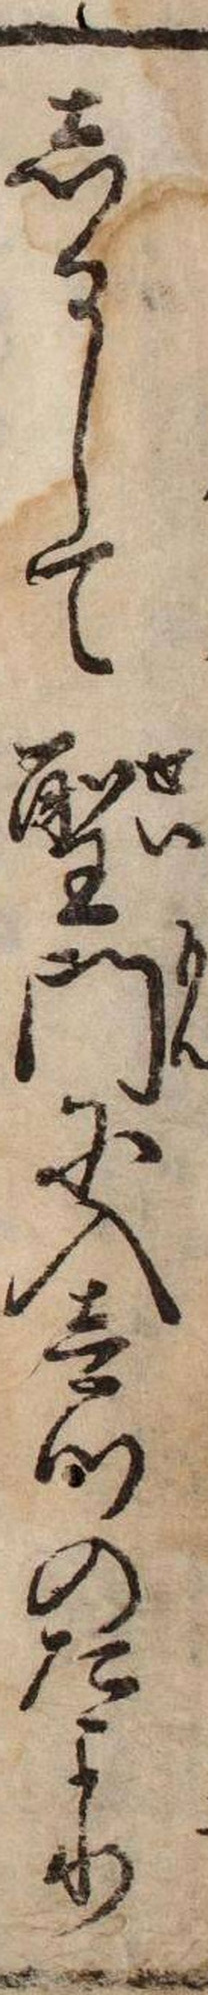しるして聖門に入壱つのたより
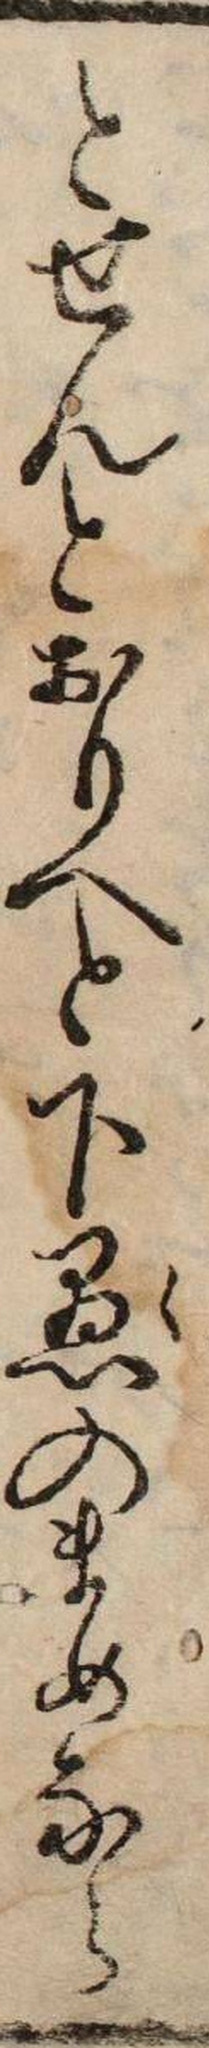とせんとおもへと下愚のまめなら
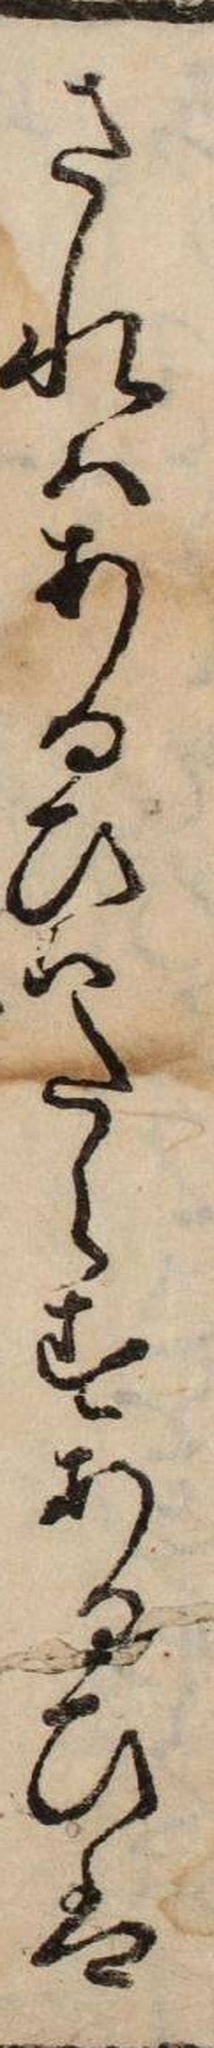されはあるひはたらすあるひは
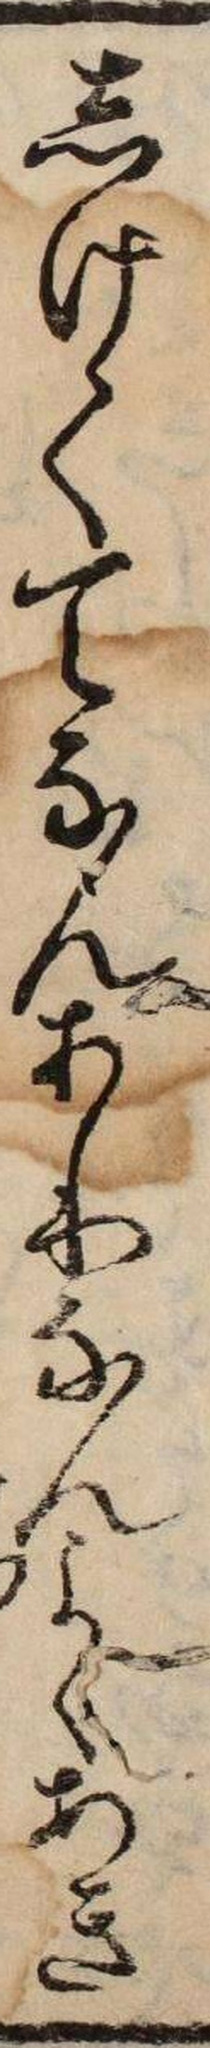しけくてなんありなんよくあき
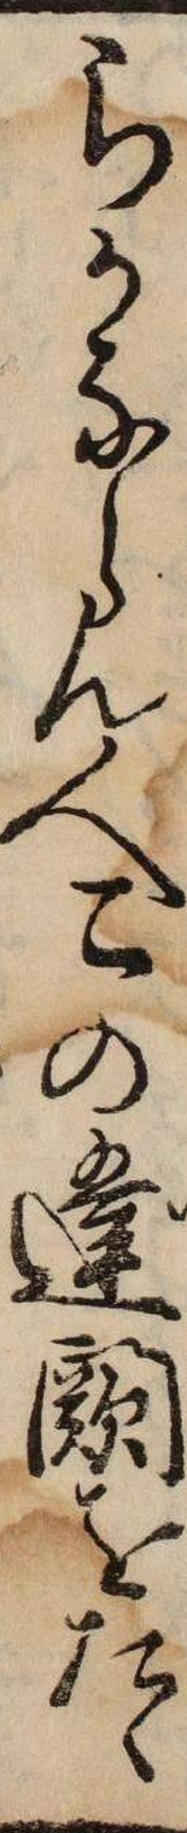らかならん人この違闕をたた
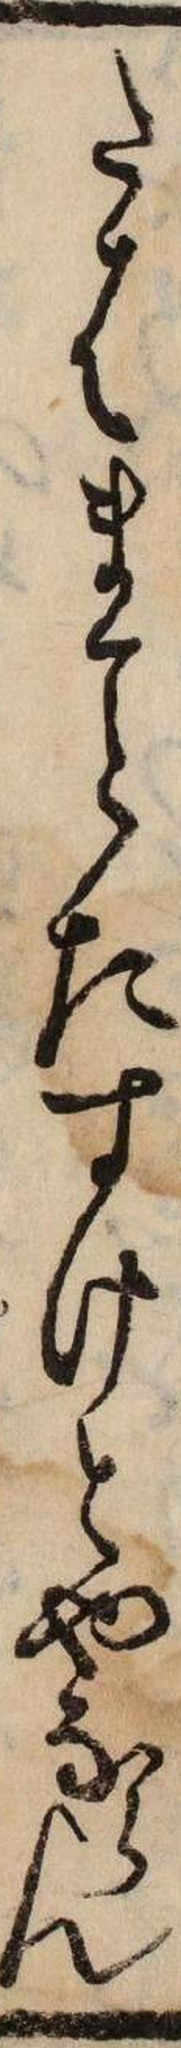たはまことたすけとやならん
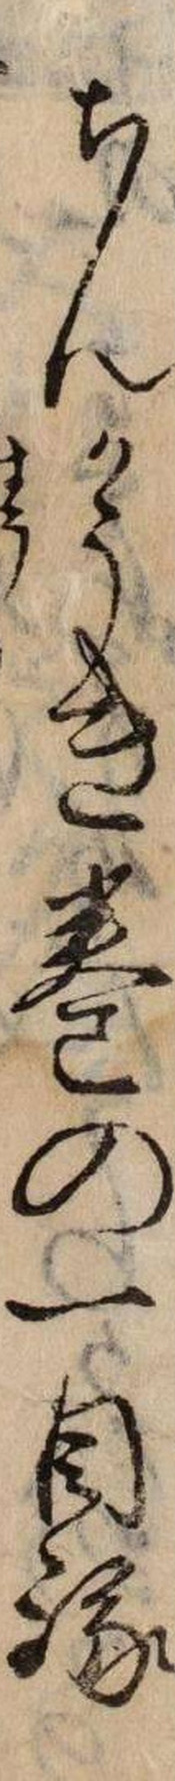ちんかうき巻の一目録
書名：塵劫記（寛永11年自跋、京都府立京都学・歴彩館追貴8）
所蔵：京都府立京都学・歴彩館 国文学研究資料館
